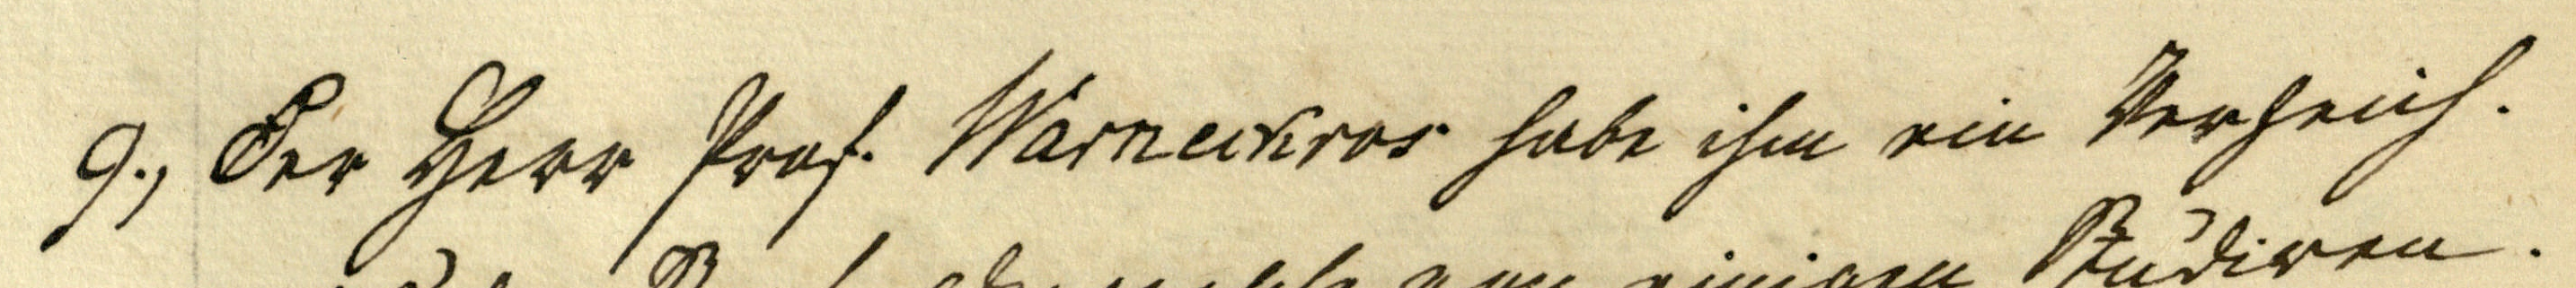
9., Der Herr Prof. Warneckros habe ihm ein Verzeich¬
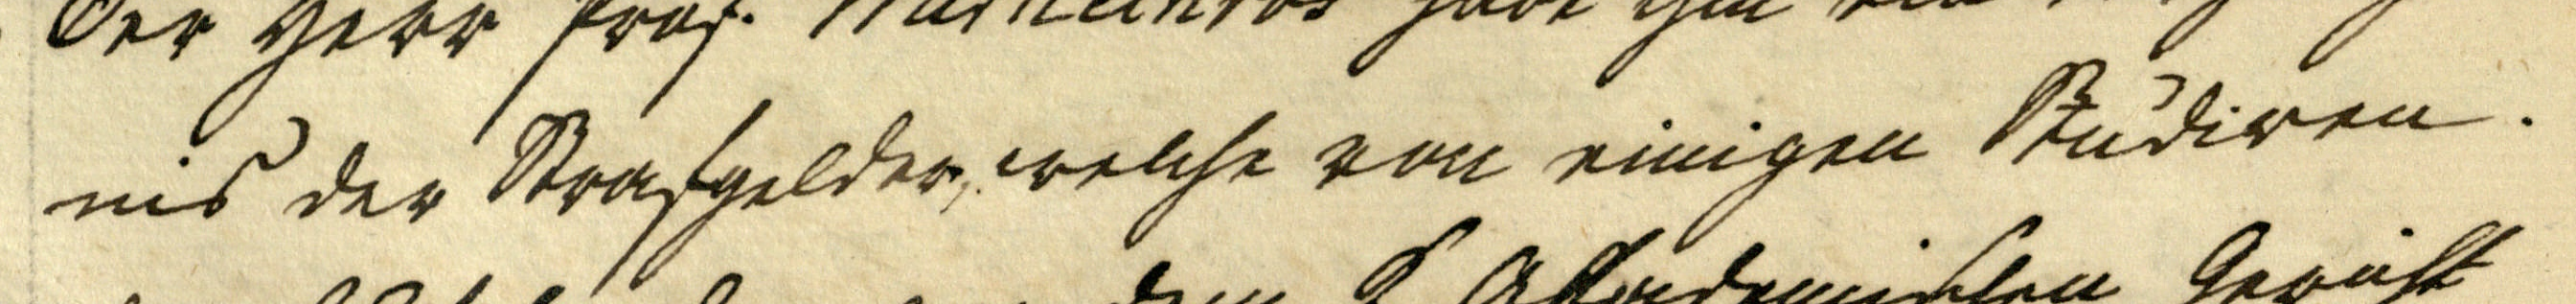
nis der Strafgelder, welche von einigen Studiren¬
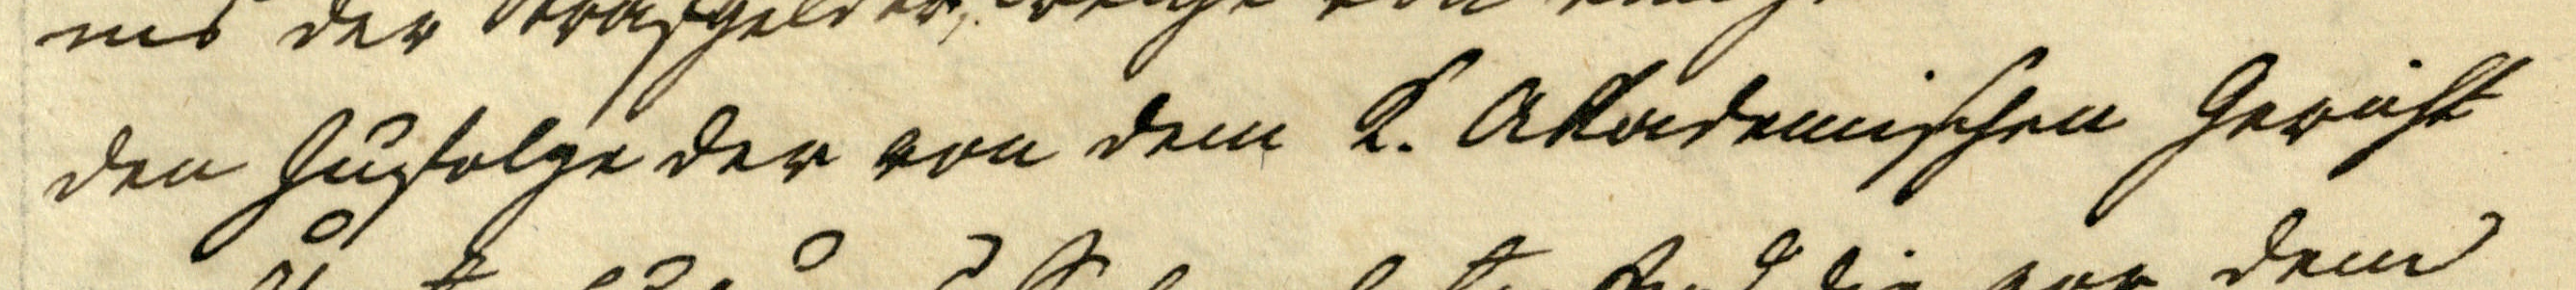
den zufolge der von dem K. Akademischen Gericht
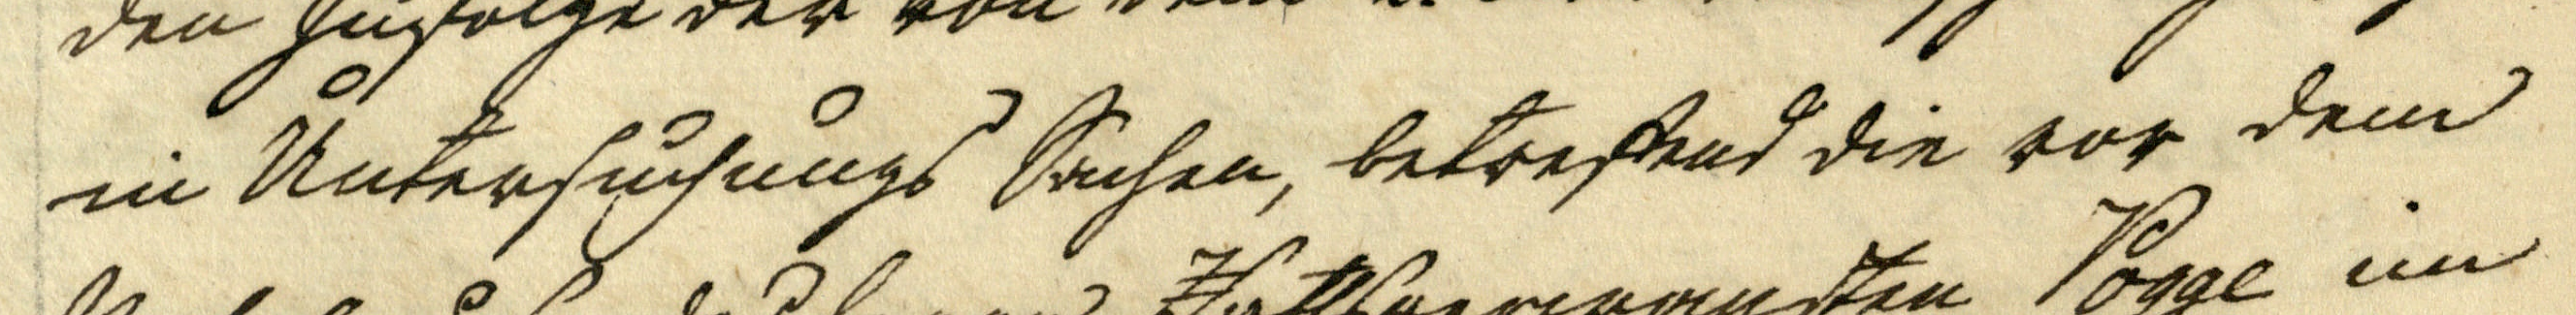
in Untersuchungs Sachen, betreffend die vor dem
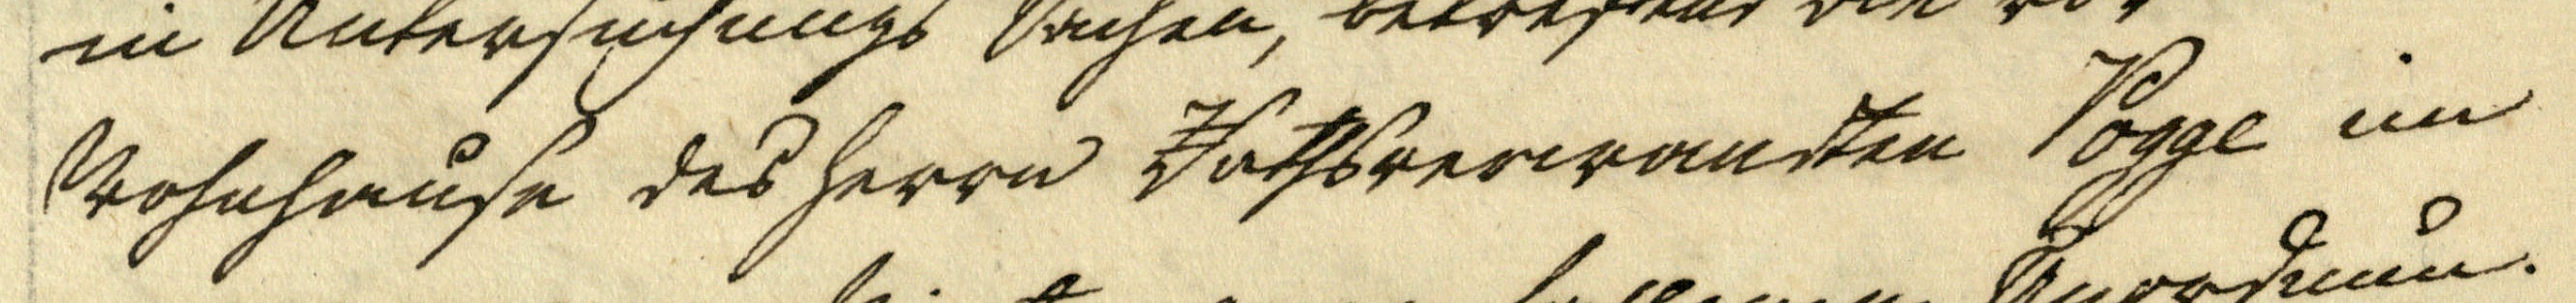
Wohnhause des Herrn Rathsverwandten Pogge in
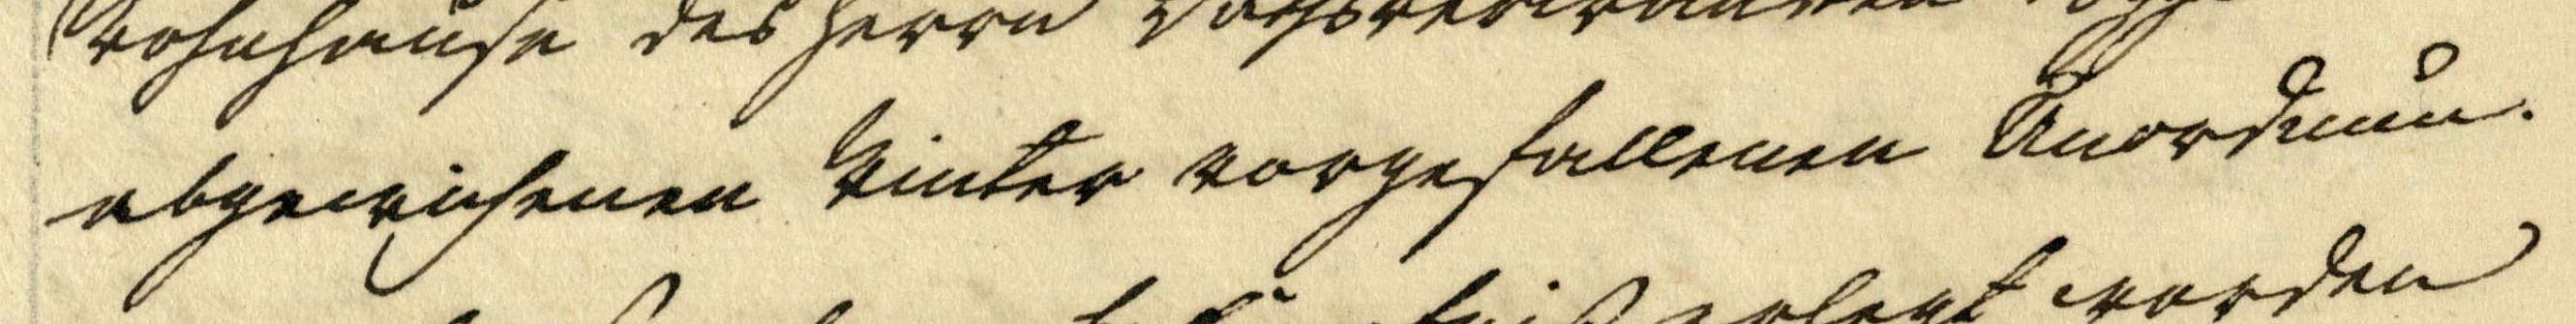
abgewichenen Winter vorgefallenen Unordnun¬
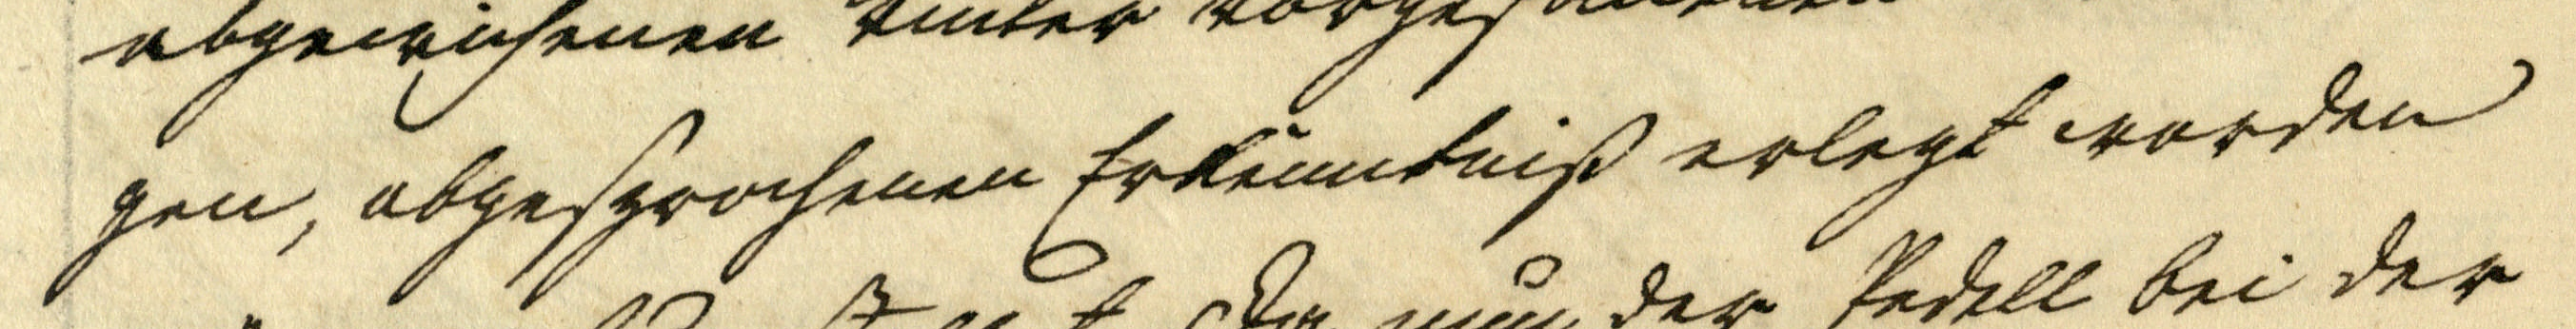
gen, abgesprochenen Erkentniß erlegt worden
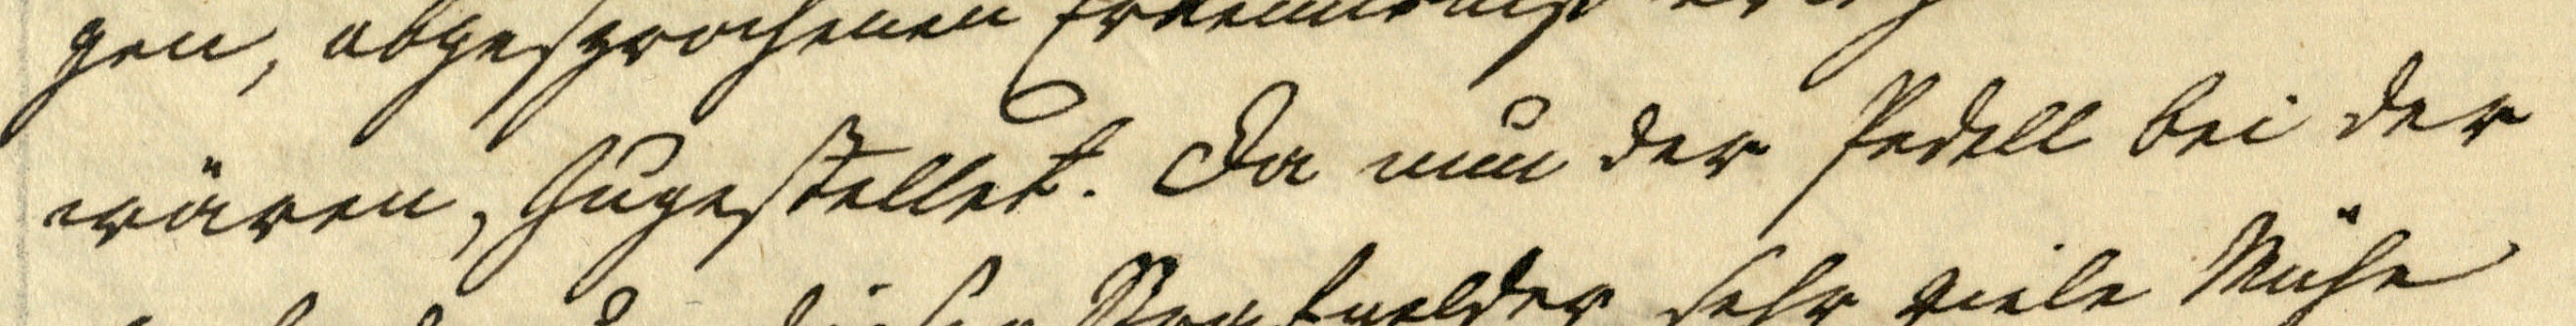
wären, zugestellet. Da nun der Pedell bei der
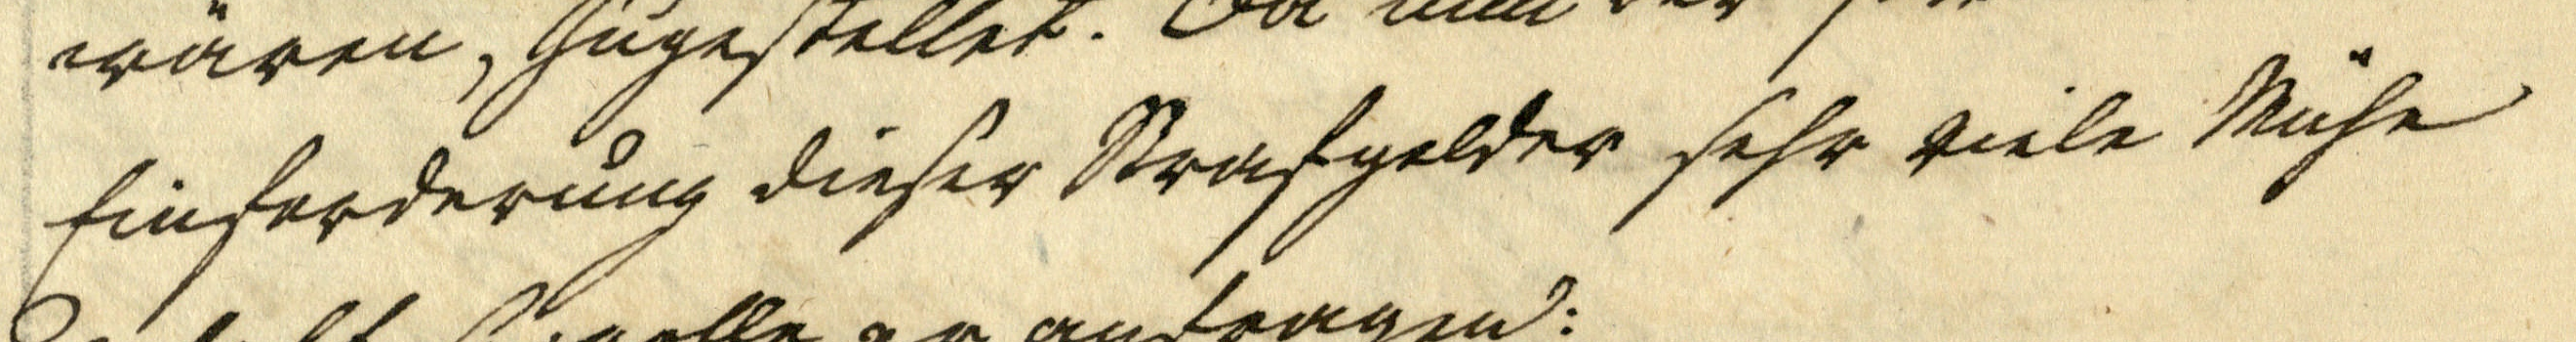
Einforderung dieser Strafgelder sehr viele Mühe
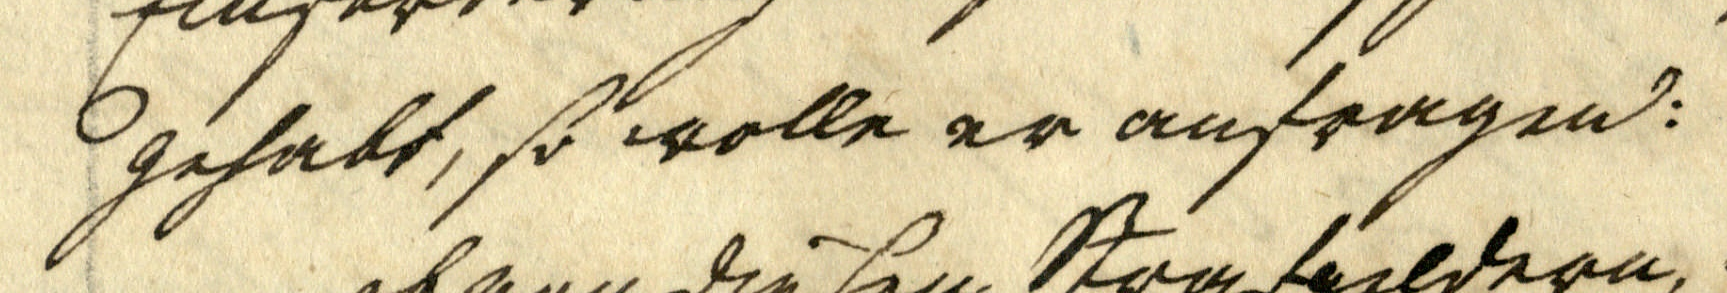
gehabt, so wolle er anfragen:
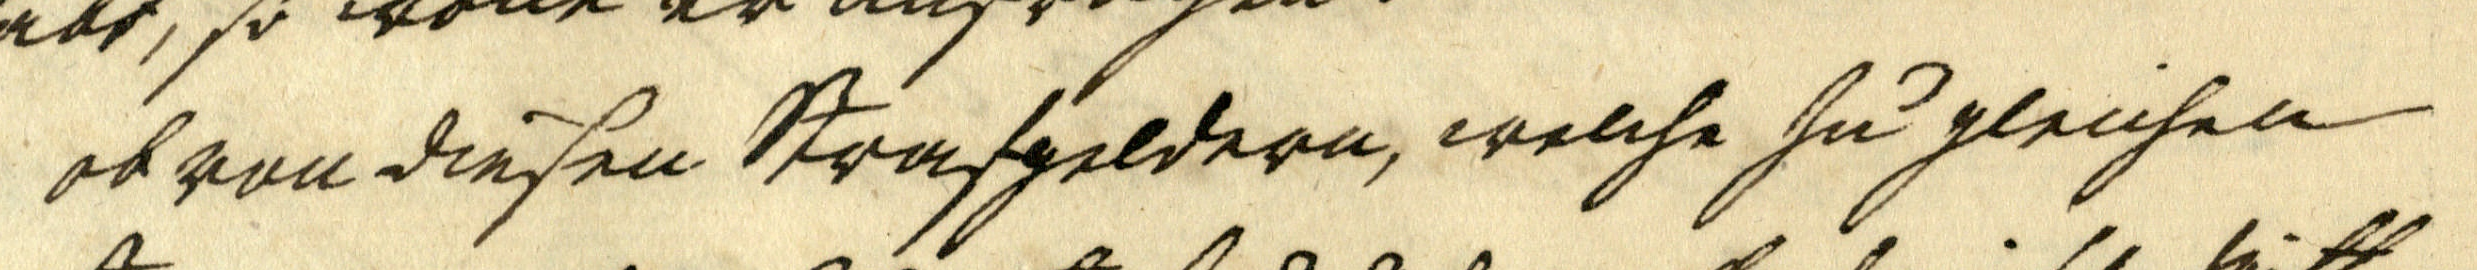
ob von diesen Strafpgeldern, welche zu gleichen
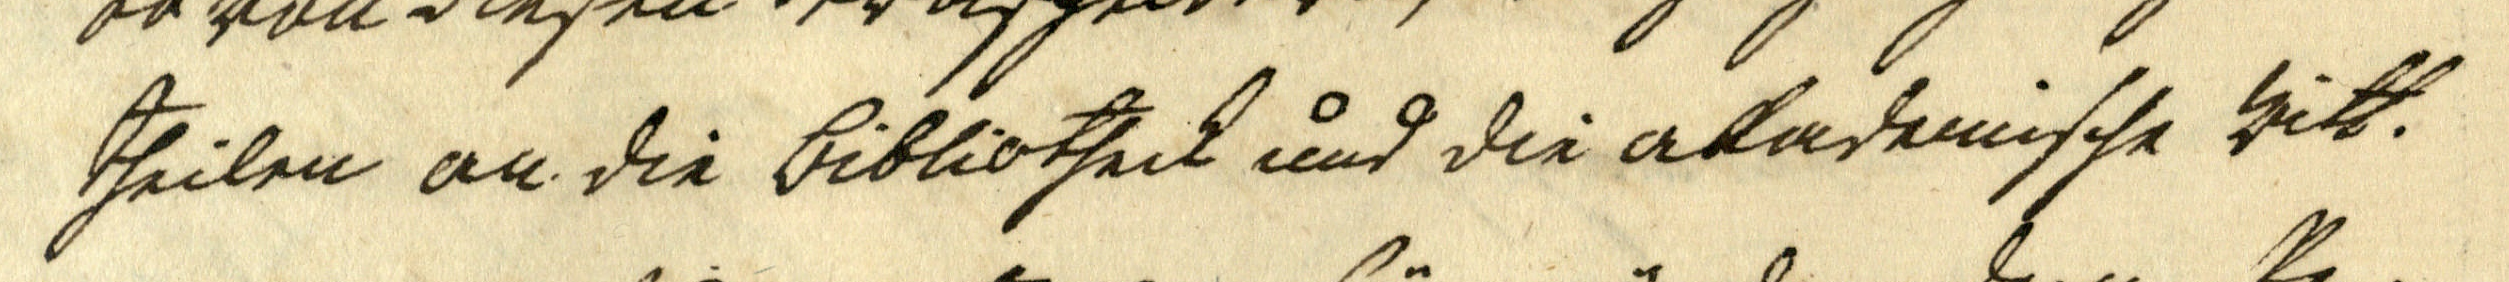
Theilen an die Bibliotheck und die akademische Witt¬
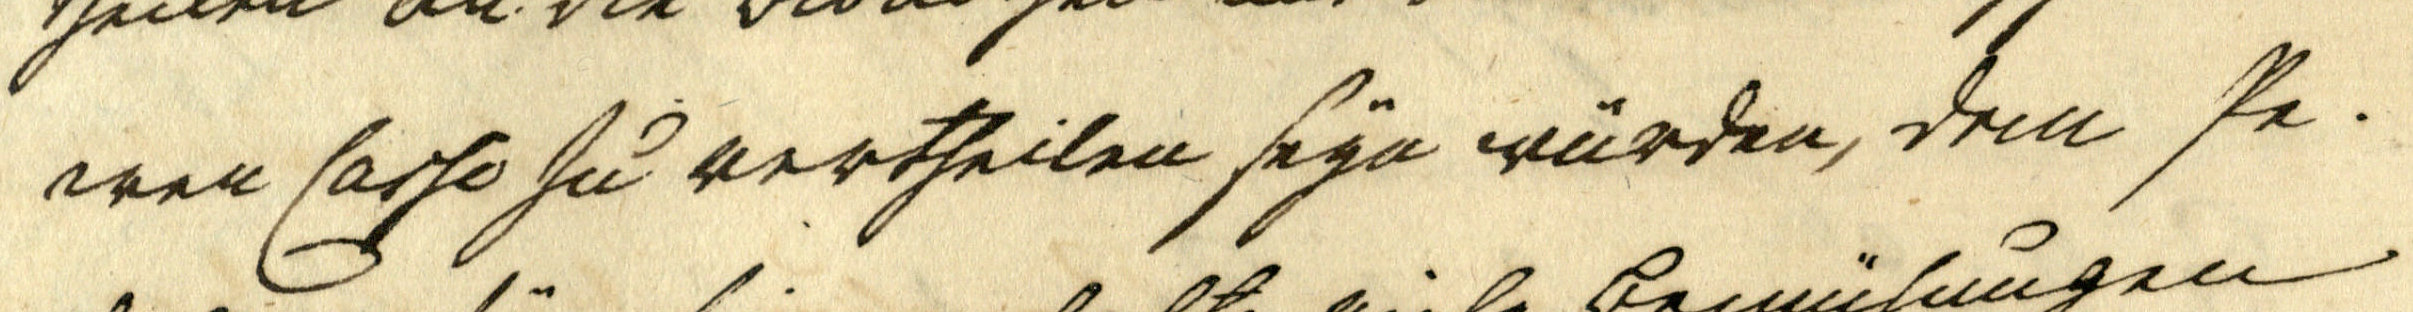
wen Casse zu vertheilen seÿn würden, dem Pe¬
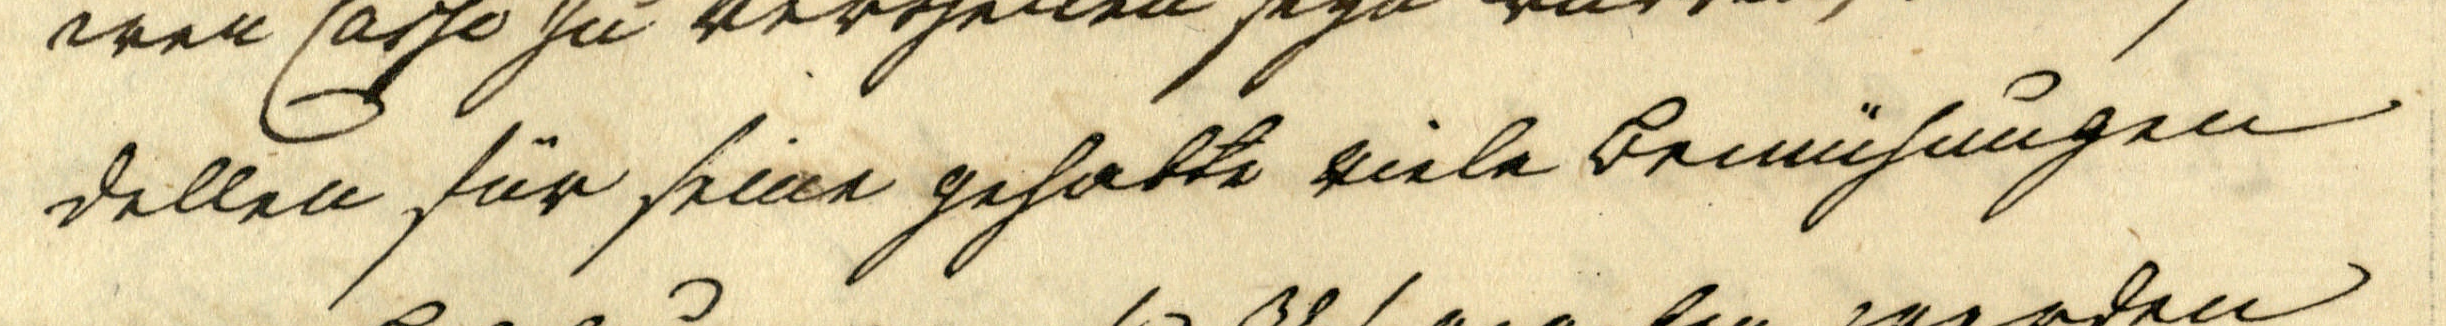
dellen für seine gehabte viele Bemühungen
